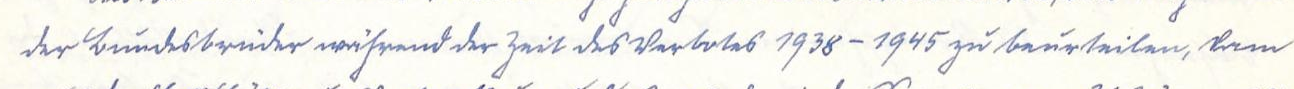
der Bundesbrüder während der Zeit des Verbotes 1938-1945 zu beurteilen, kam
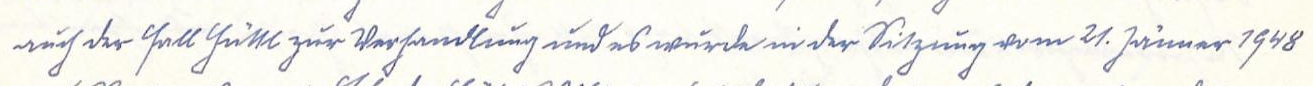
auch der Fall Hüttl zur Verhandlung und es wurde in der Sitzung vom 21. Jänner1948
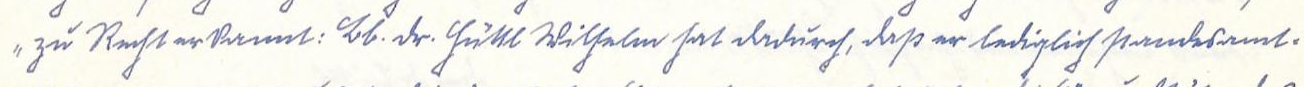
- zu Recht erkannt: Bb. Dr. Hüttl Wilhelm hat dadurch, dass er lediglich standesamt-
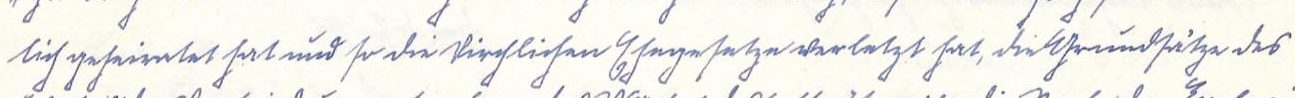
lich geheiratet hat und so die kirchlichen Ehegesetze verletzt hat, die Grundsätze des
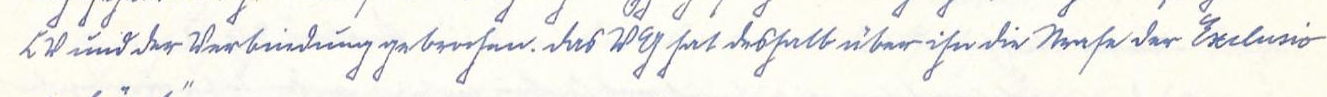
CV und der Verbindung gebrochen. Das VG hat deshalb über ihn die Strafe der Exclusio
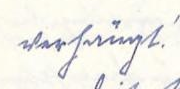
verhängt."
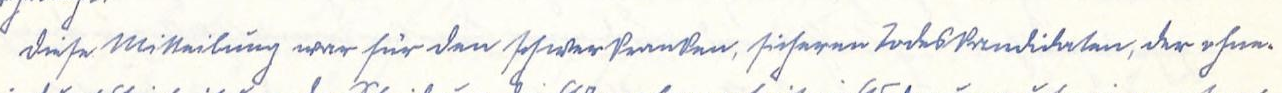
Diese Mitteilung war für den schwerkranken, sicheren Todeskandidaten, der ohne-
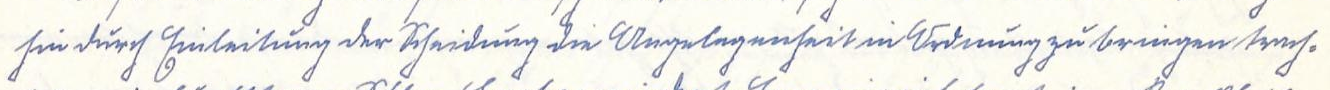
hin durch Einleitung der Scheidung die Angelegenheit in Ordnung zu bringen trach-
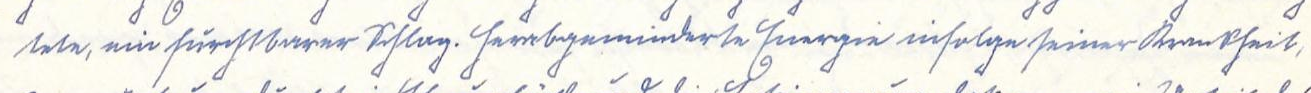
tete, ein furchtbarer Schlag. Herabgeminderte Energie infolge seiner Krankheit,
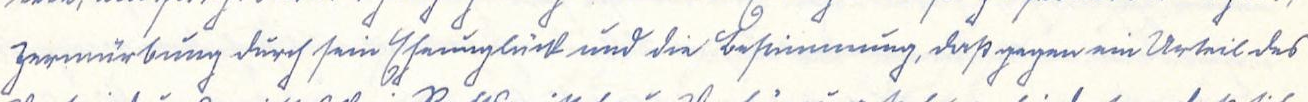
Zermürbung durch sein Eheunglück und die Bestimmung, daß gegen ein Urteil des
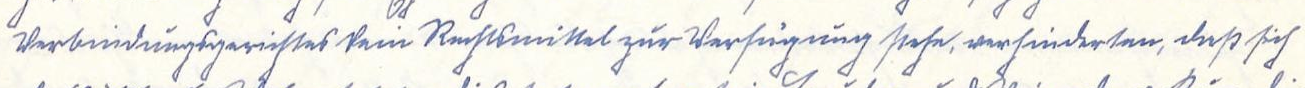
Verbindungsgerichtes keim Rechtsmittel zur Verfügung stehe, verhinderten, daß sich
